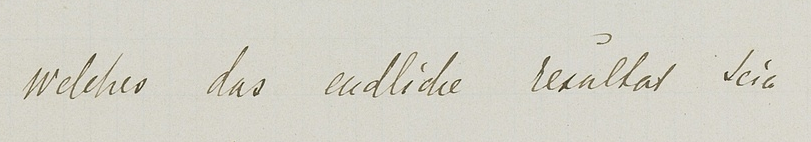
welches das endliche Resultat sein
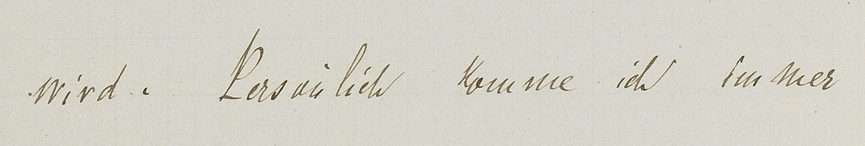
wird. Persönlich komme ich immer
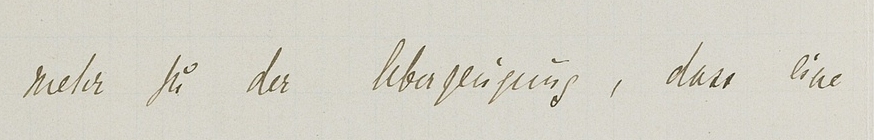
mehr zu der Überzeugung, dass eine
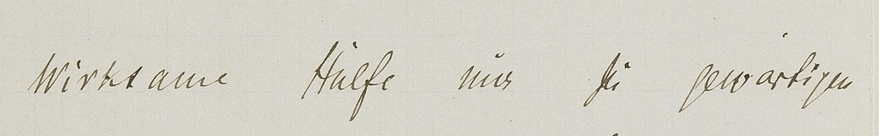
wirksame Hülfe nur zu gewärtigen
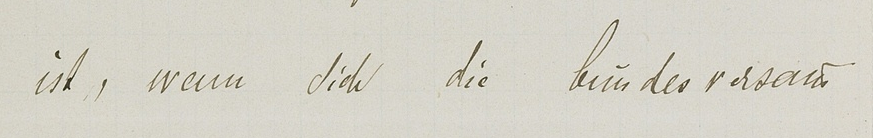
ist, wenn sich die Bundesversamm-
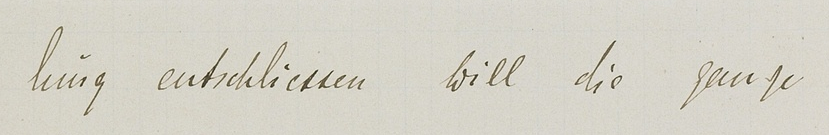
lung entschliessen will die ganze
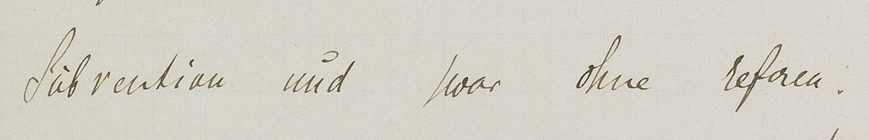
Subvention und zwar ohne Referen-
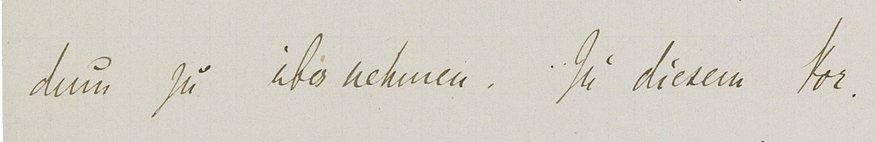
dum zu übernehmen. Zu diesem Vor-
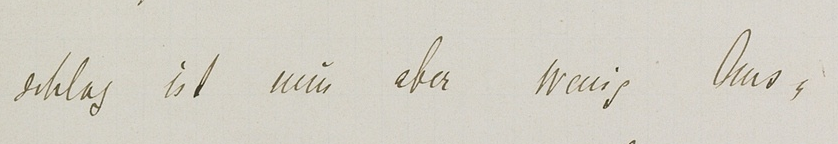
schlag ist nun aber wenig Aus-
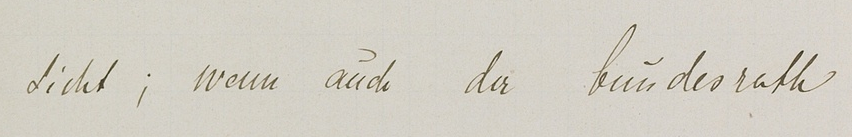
sicht; wenn auch der Bundesrath
